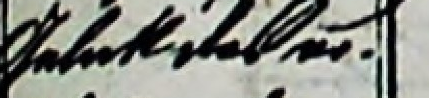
Gelak des u.
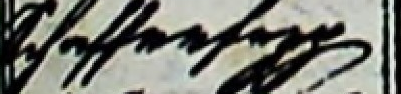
Schaffersepp
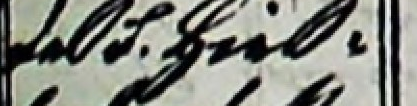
das S. Hirs„
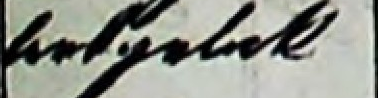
lersgelak
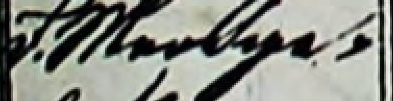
S. Mersge„
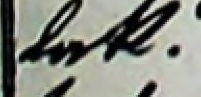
lak.
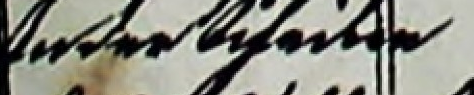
In der Scheiben
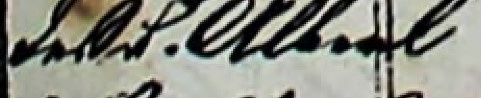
des S. Alberl
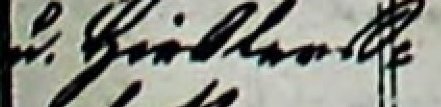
u. Hirslers„
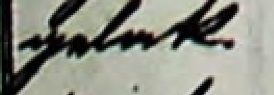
gelak
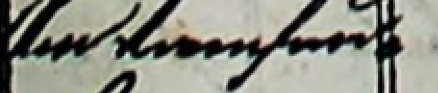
Am Denchau
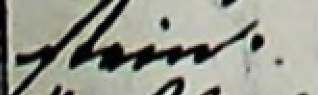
stein.
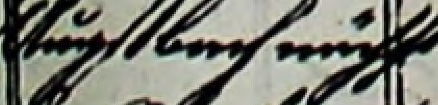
Augstbach nächst
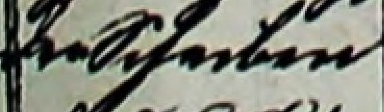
der Scheiben
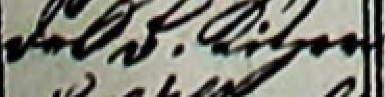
des S. Kitzer
